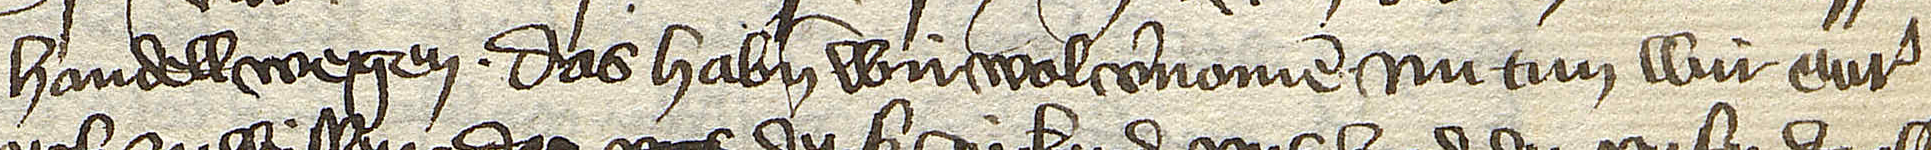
handell wegen . das habn* wir wol v*nome* Nu tun wir ewr*
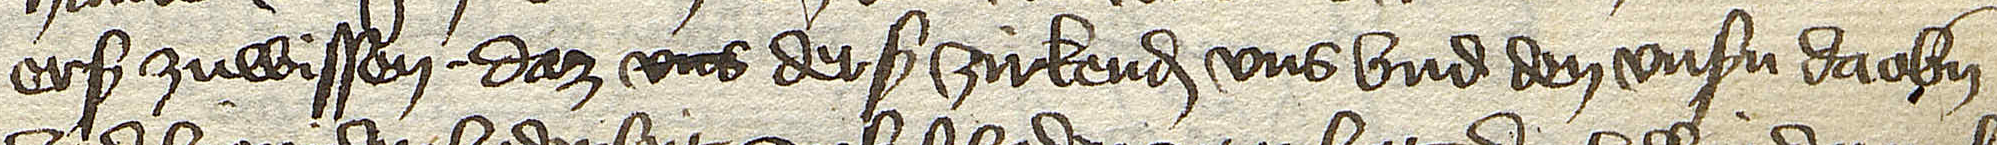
erſ* cʒuwiſſen . daʒ vns derſ* cʒirkend* vns vnd den vnſ*n da obn*
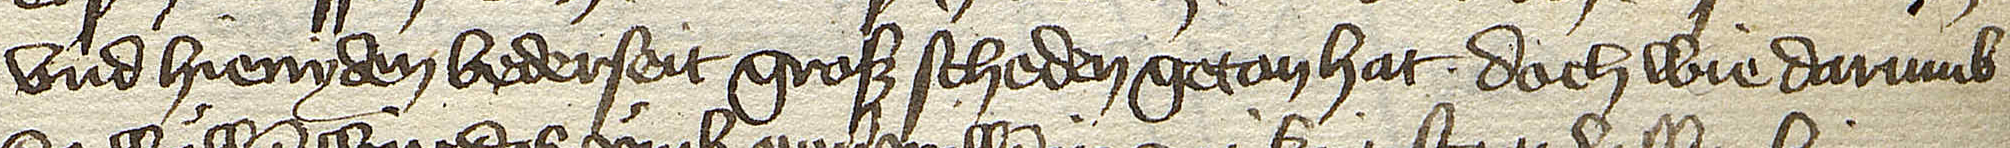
vnd hiernyden bederſeit groſʒ ſcheden getan hat . doch wie darumb
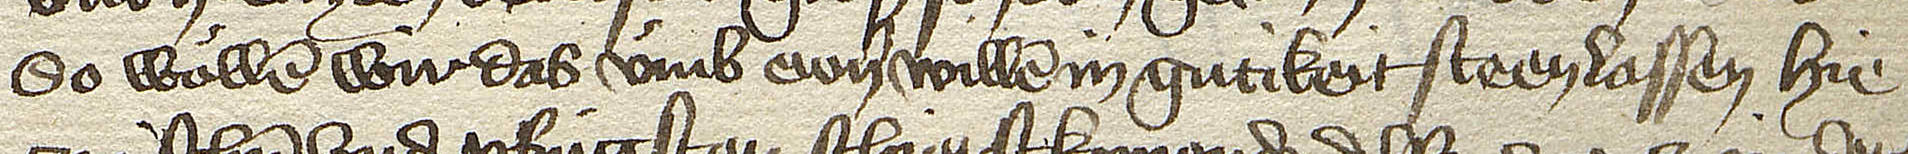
So wölle* wir das v̈mb ew*n wille* in gutikeit ſteen laſſen hie
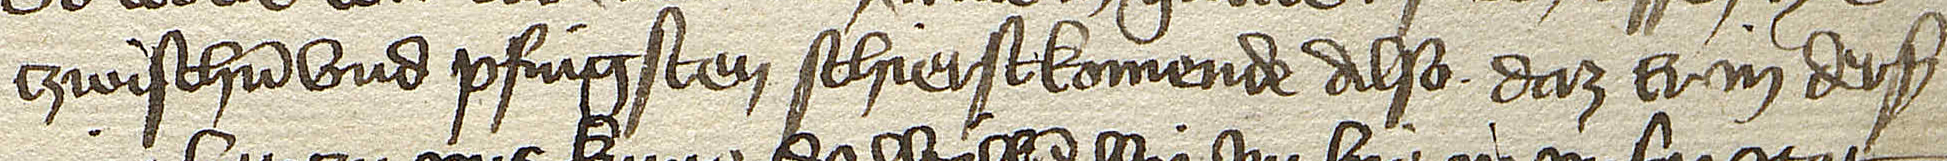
cʒwiſchn* vnd pfingſten ſchierſt komende Alſo . daʒ Er in derſ*
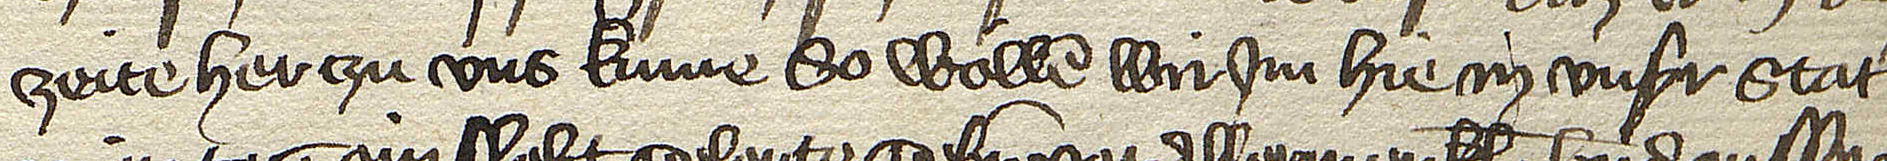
cʒeite her cʒu vns kume So wölle* wir Im hie in vnſ*r Stat
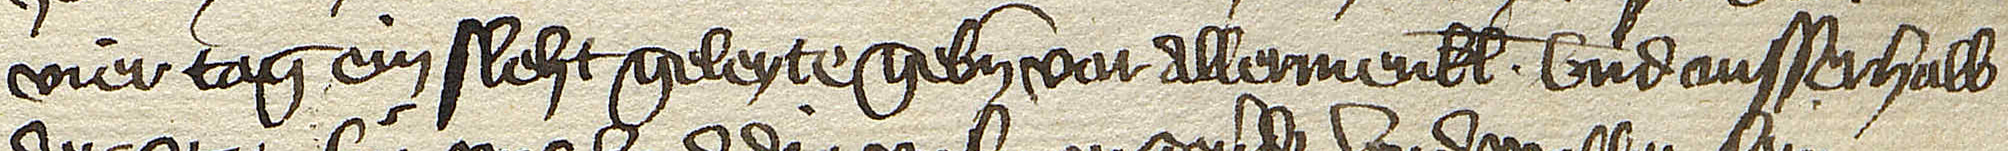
vier tag ein ſleht geleyte gebn* vor Allermenkl* . vnd auſſerhalb
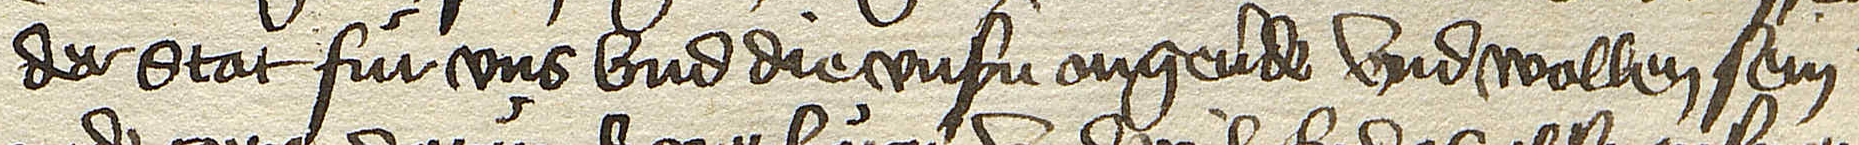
der Stat für vns vnd die vnſ*n ongeu*de vnd wollen ſein
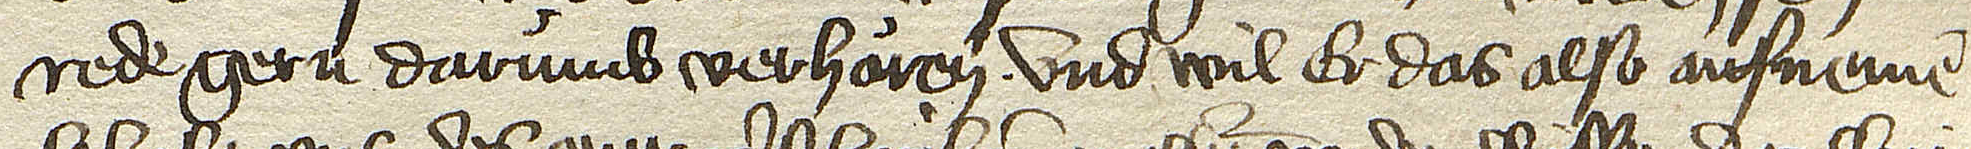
rede gern darümb verhören . vnd wil Er das alſo aufneme*
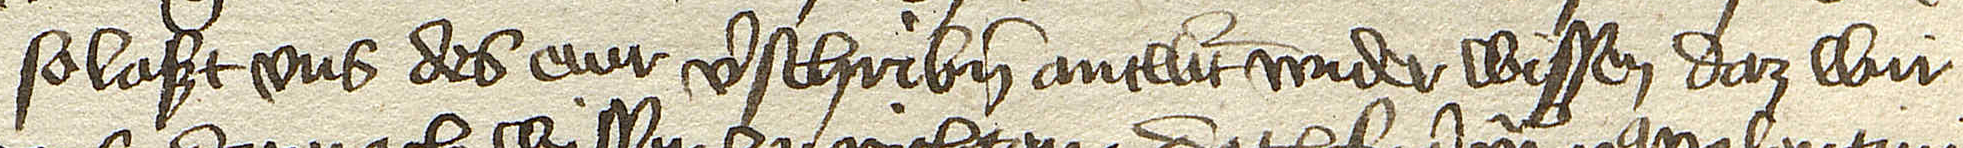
ſo laſʒt vns des ewr v*ſchribn* antw*t wider wiſſen daʒ wir
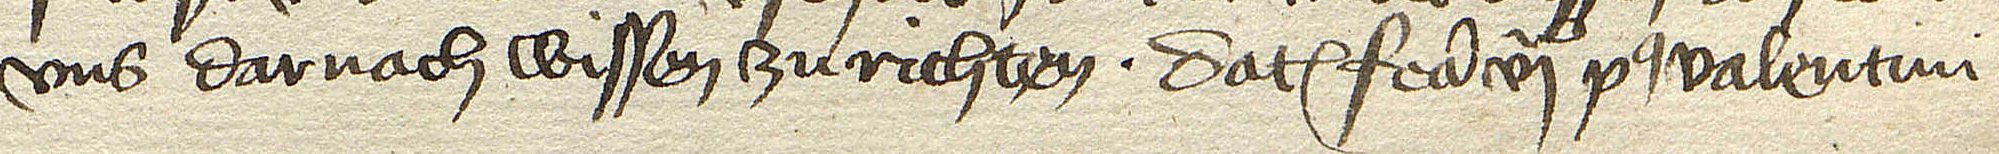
vns darnach wiſſen cʒu richten . Dat* fea* vi* p* valentini
